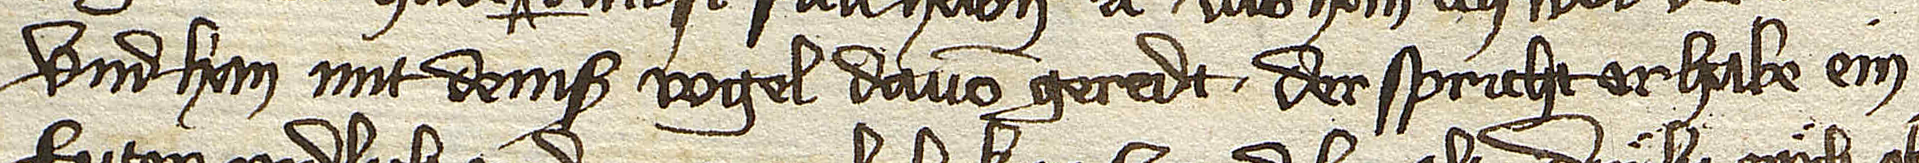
vnd han mit demſ* vogel dauo* geredt / der ſpricht er habe ein
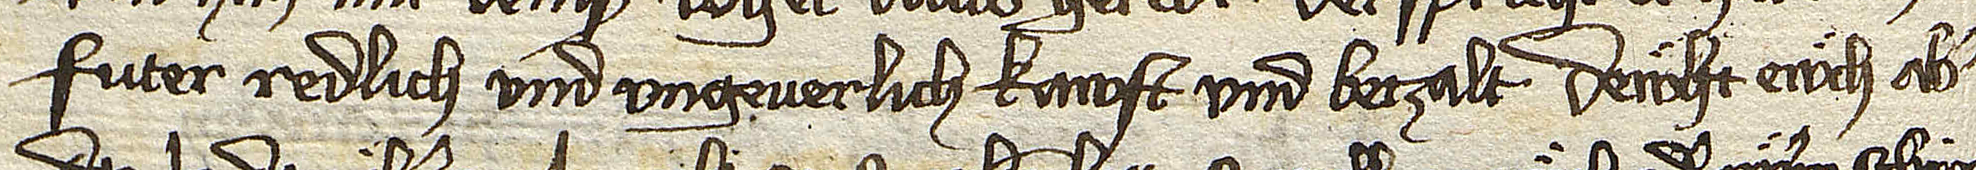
futer redlich vnd vngeuerlich kawft vnd becʒalt Dewht ewch ab*
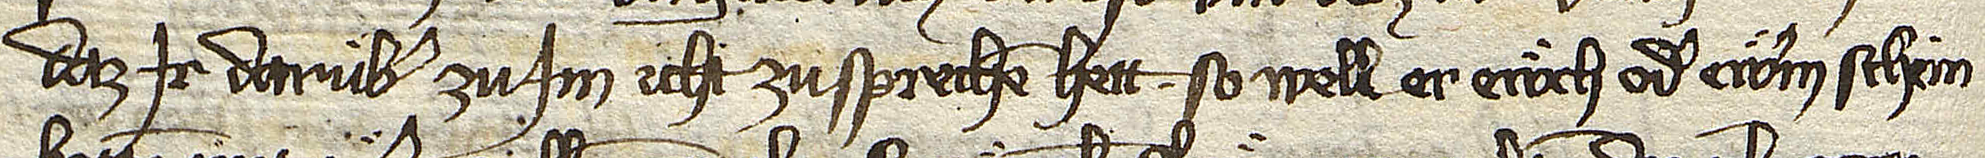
daʒ Ir darüb* ʒu Im icht ʒuſpreche* hett . ſo well er ewch od* ew*m ſchein
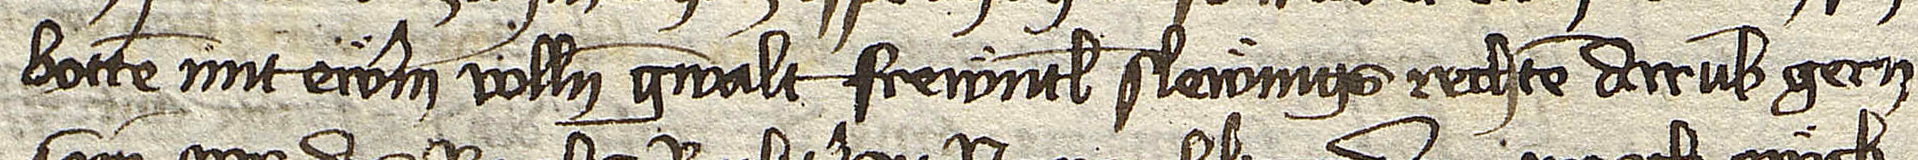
botte* mit ew*m volln* gwalt frewntl* ſlewnigs rechte* darub* gern
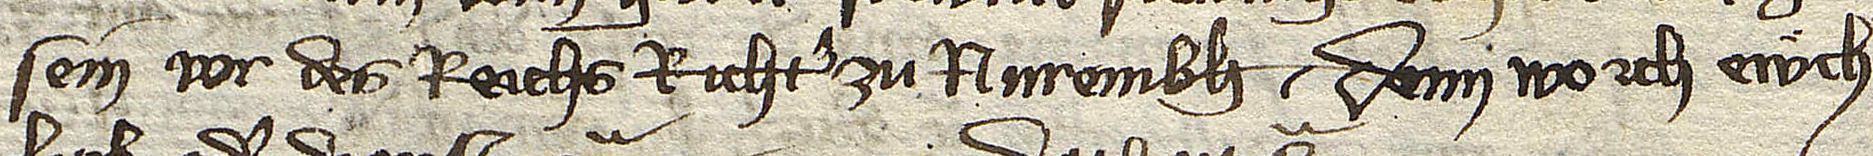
ſein vor des Reichs Richt* ʒu Nurembg* / Denn wo ich ewch
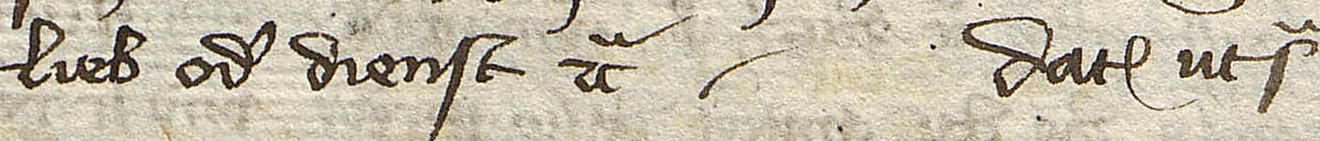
lieb od* dienſt ec* / dat* ut ſ*
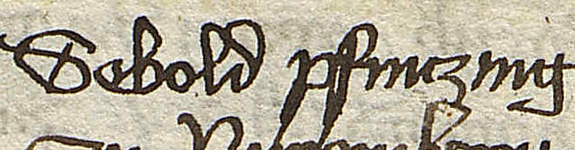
Sebold Pfincʒing
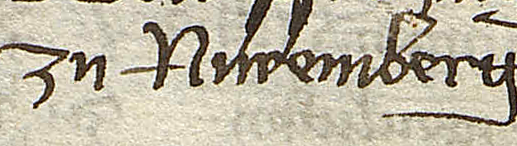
ʒu Nuremberg
